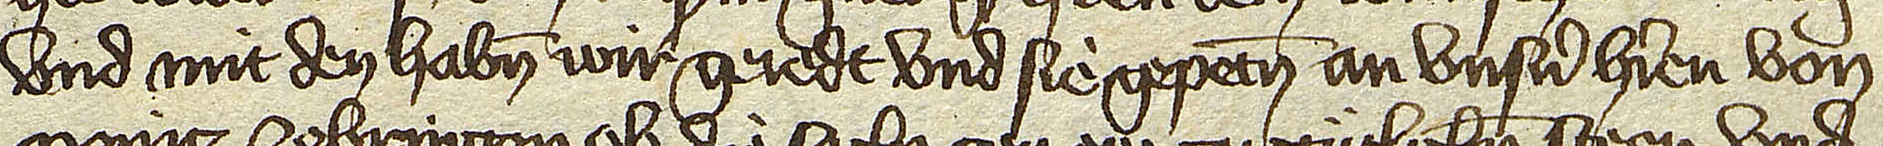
vnd mit den habn* wir geredt vnd ſie gepetn* an vnſn* h*ren von
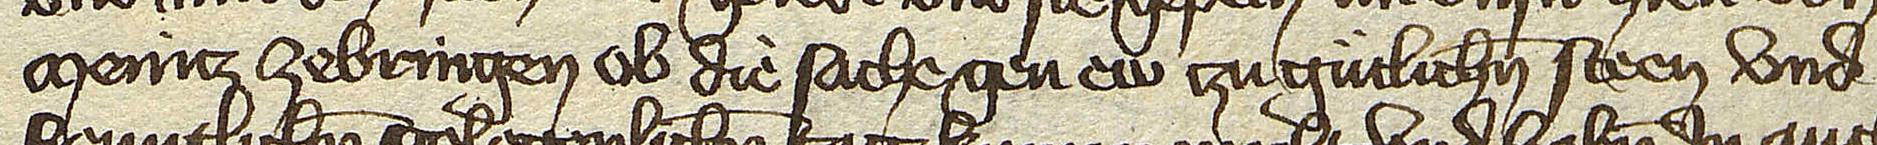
Meincʒ cʒebringen ob die ſache gen ew cʒu gütlichn* ſteen vnd
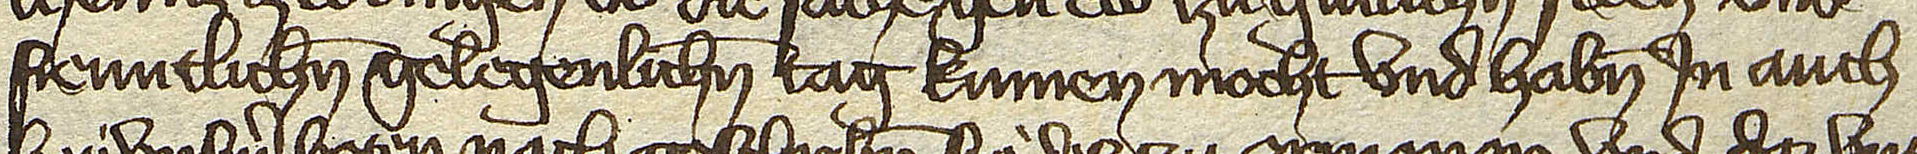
freuntlichn* gelegenlichn* tag kumen mocht vnd habn* In auch
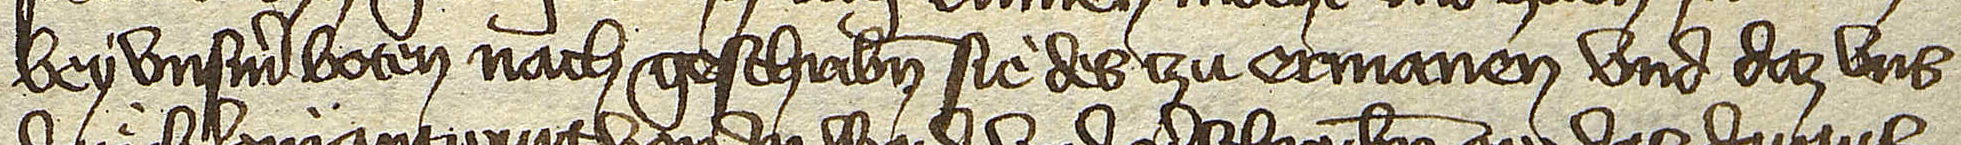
bey vnſm* boten nach geſchribn* ſie des cʒu ermanen vnd daʒ vns
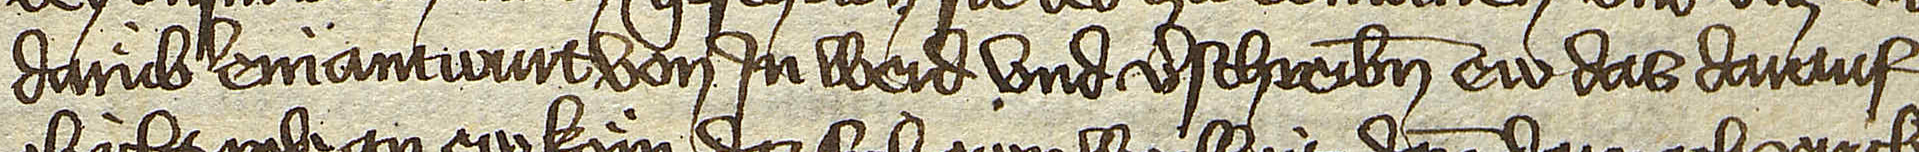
darüb* ein antwurt von In werd vnd v*ſchreibn* ew das darauf
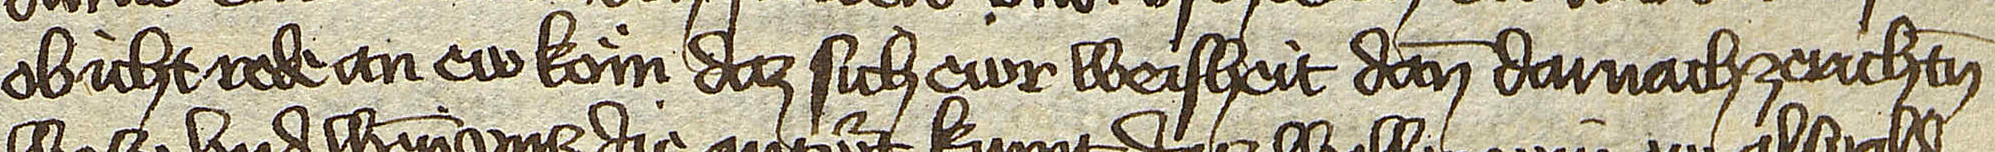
ob icht rede an ew köm daʒ ſich ewr weiſheit dan* darnach cʒerichtn*
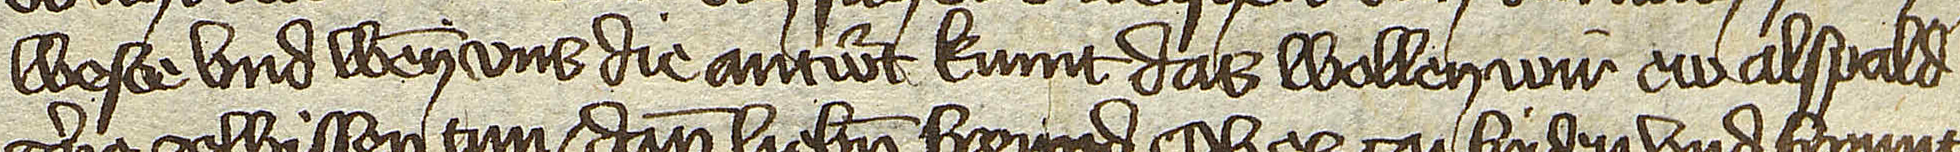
weſte vnd wen* vns die antw*t kumt das wollen wir ew alſpald
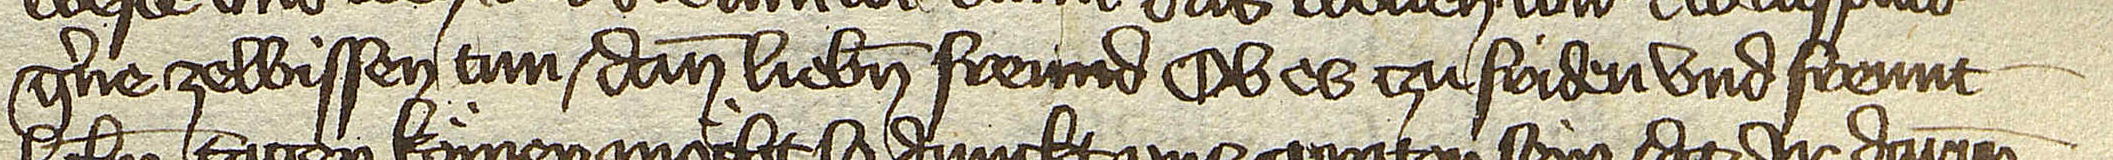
g*ne cʒewiſſen tun / dan* liebn* freund Ob es cʒu friden vnd freunt -
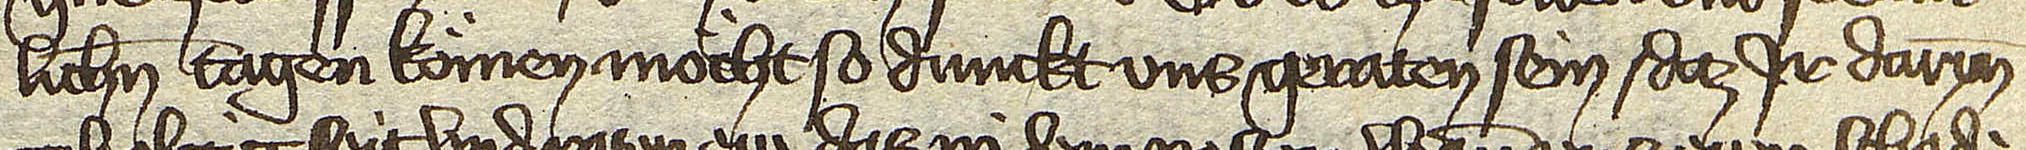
lichn* tagen kömen möcht ſo dunckt vns geraten ſein / daʒ Ir daryn*
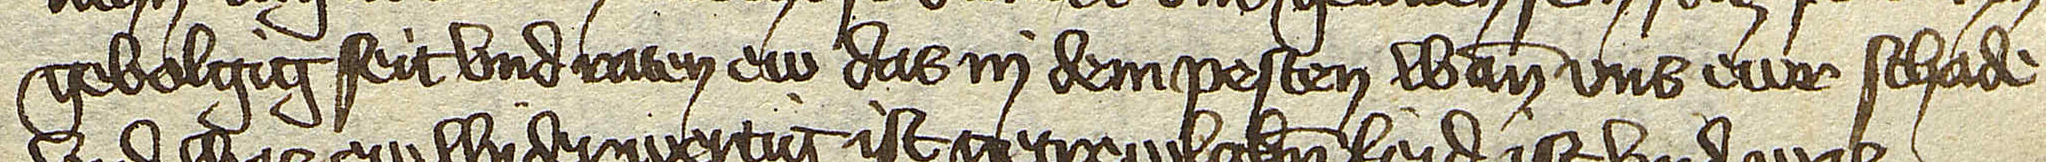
gevolgig ſeit vnd raten ew das in dem peſten wan* vns ewr ſchade
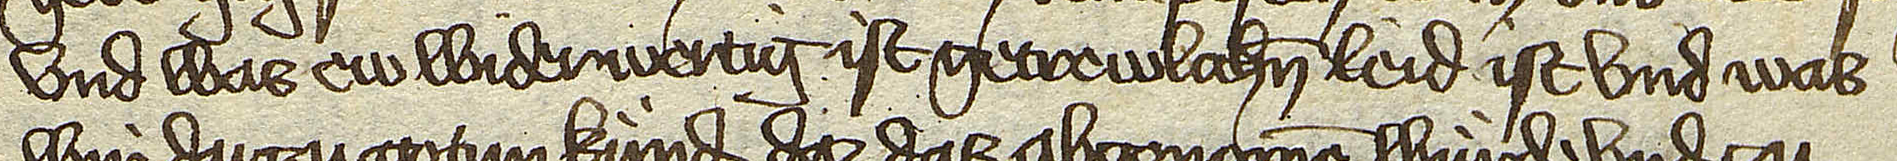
vnd was ew widerwertig iſt getrewlichn* leid iſt vnd was
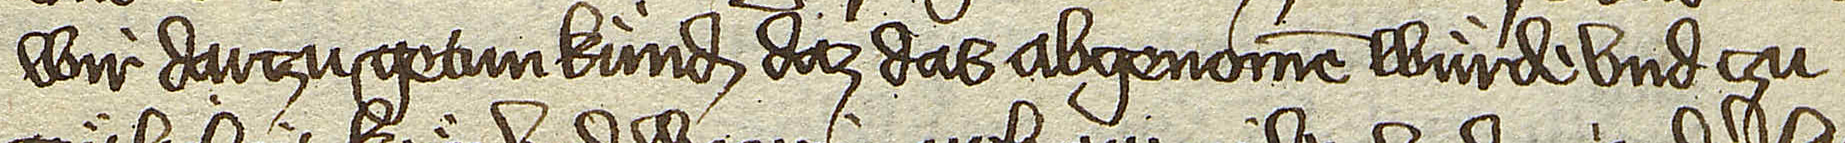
wir darcʒu getun künd* daʒ das abgenome* würde vnd cʒu
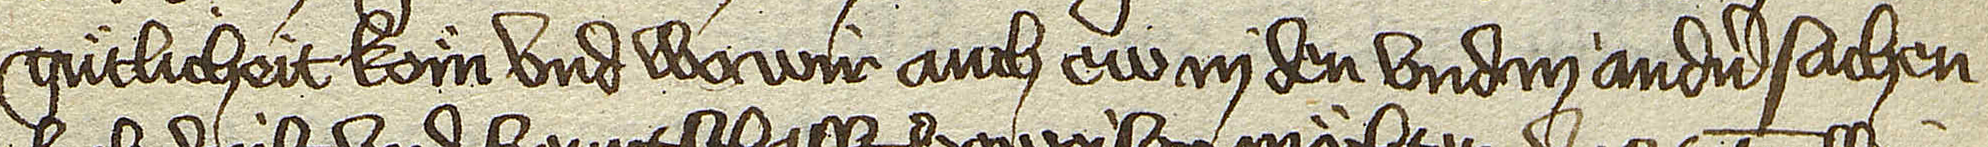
gütlicheit köm vnd wo wir auch ew in den vnd in andn* ſachen
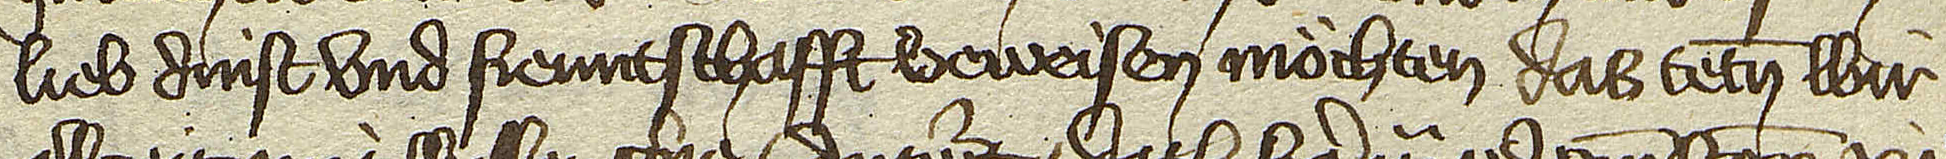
lieb dinſt vnd freuntſchafft beweiſen möchten das tetn* wir
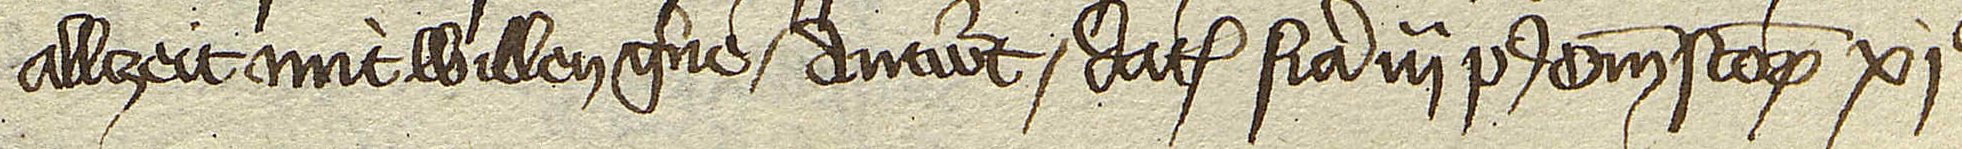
allcʒeit mit willen g*ne / Antw*t / Dat* fia* iii* p* Om* ſco* xi*
